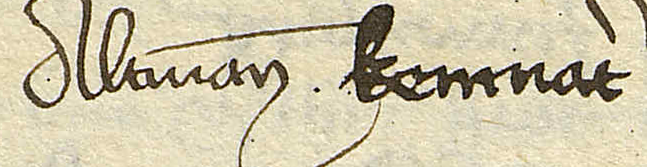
Altman* kemnat*
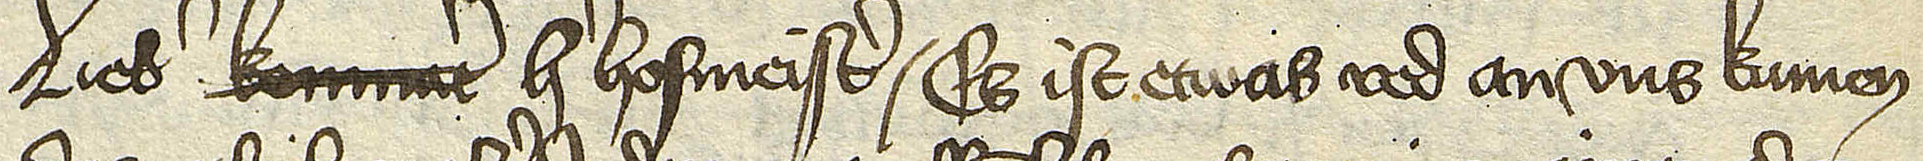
Lieb* kemnat* h* hofmeiſt* / Es iſt etwas red an vns kumen
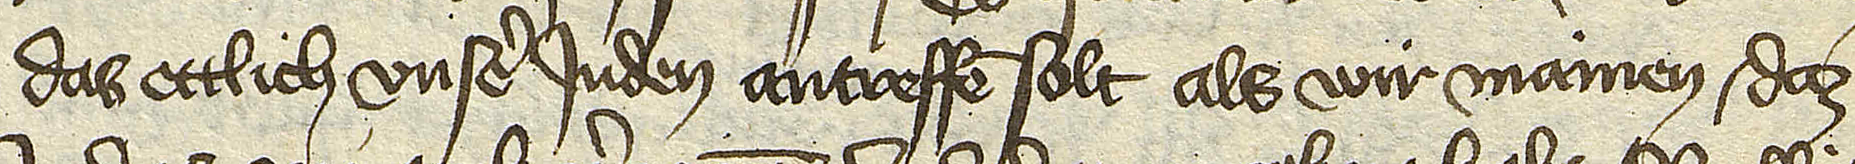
das ettlich vnſe* Iuden antreffe* ſolt als wir mainen / daʒ
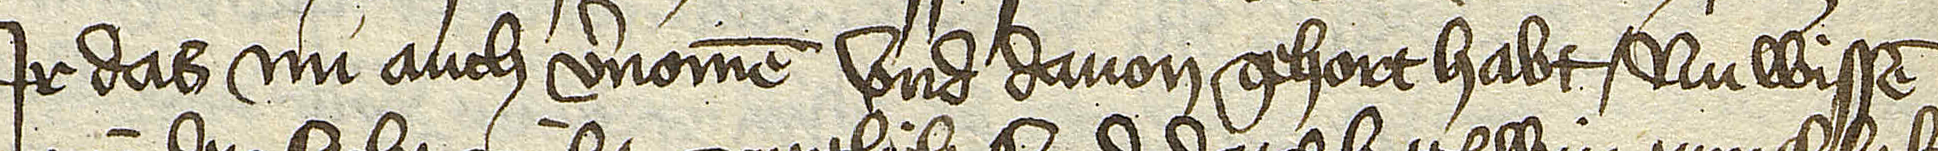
Ir das nu auch v*nome* vnd dauon gehort habt / Nu wiſſe*
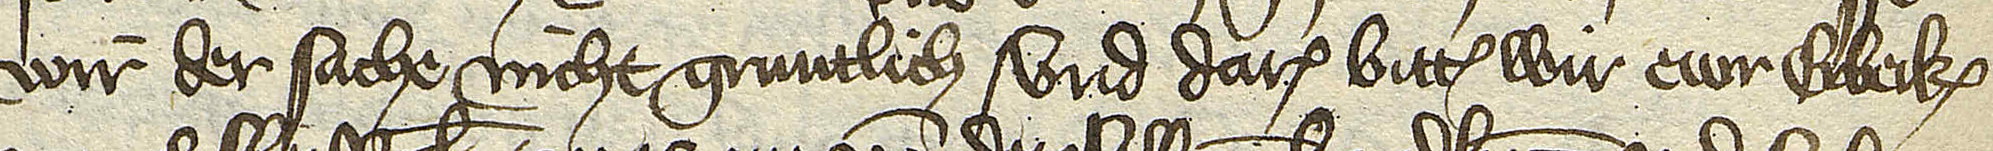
wir der ſache nicht gruntlich / vnd dar* bitt* wir ewr Erberk*
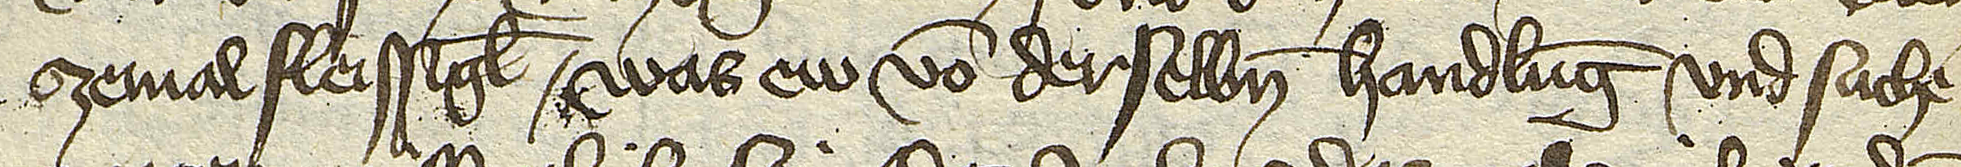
cʒemal fleiſſigl* / was ew vo* derſelbn* handlug* vnd ſache
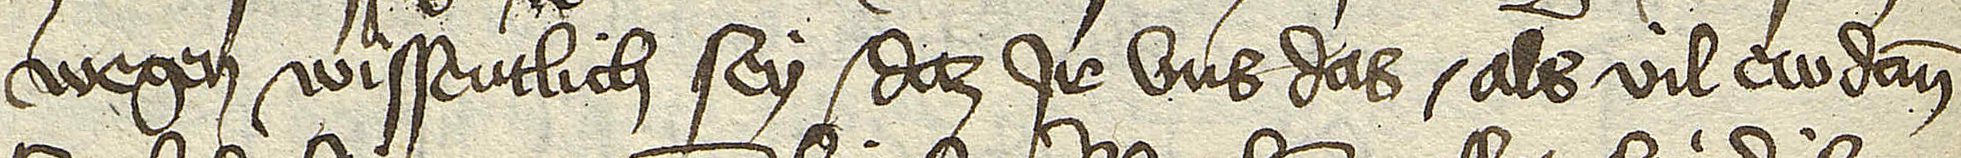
wegen wiſſentlich ſey / daʒ Ir vns das / als vil ew dan*
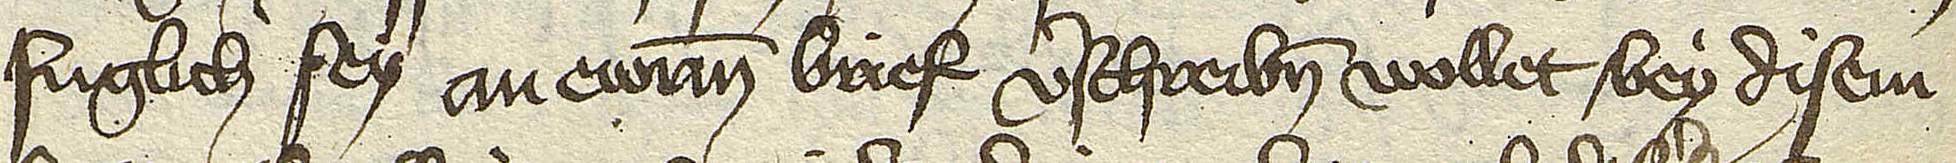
fuglich ſey an ewrm* brief v*ſchreibn* wollet / bey diſem
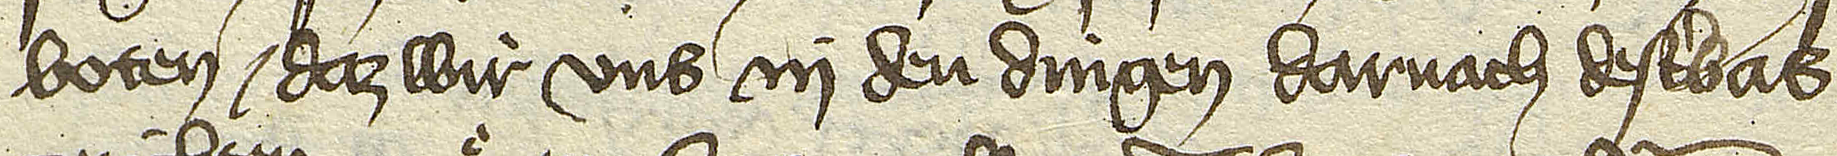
boten / daʒ wir vns in den dingen darnach deſt*bas
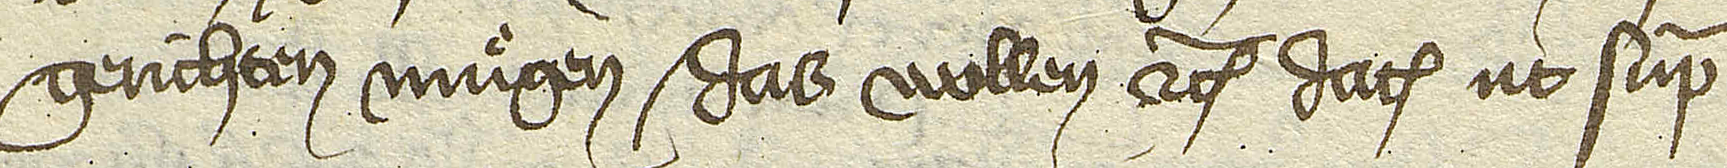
gerichten mügen / das wollen ec* dat* ut ſup*
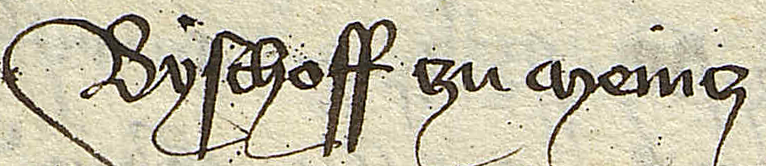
Byſchoff cʒu Meincʒ
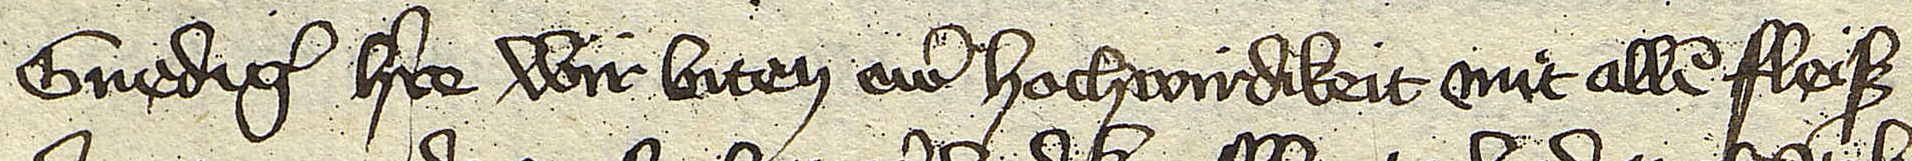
Gnedig* h*re / Wir biten ew* hochwirdikeit mit alle* fleiſʒ
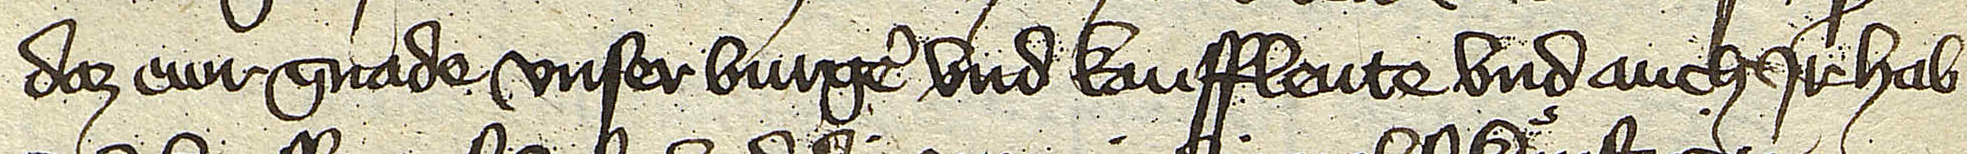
daʒ ewr gnade vnſer burge* vnd kauffleute vnd auch Ir hab
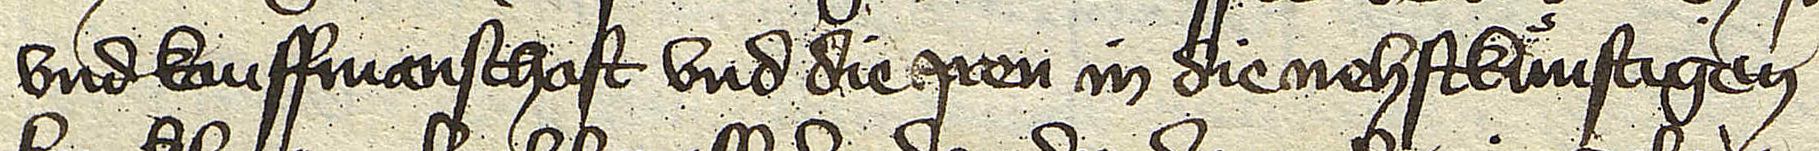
vnd kauffmanſchaft vnd die Iren in die nehſtkünftigen
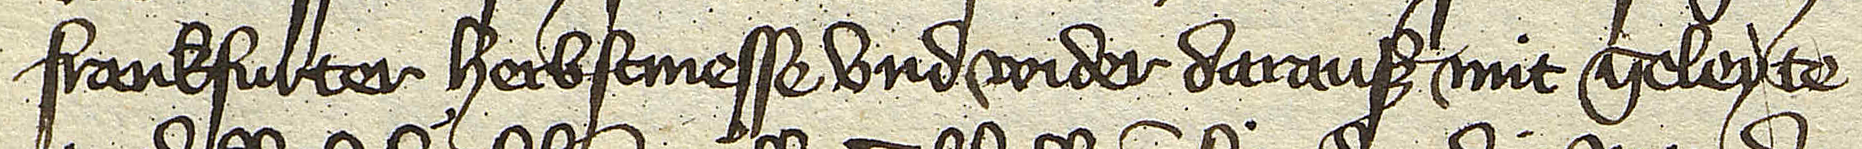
frankfurter herbſtmeſſe vnd wider darauſʒ mit geleyte
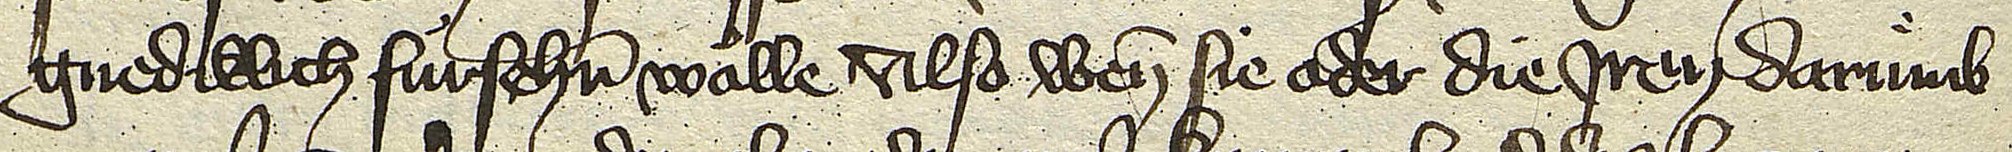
gnediklich fürſehn* wölle / Alſo wen* ſie oder die Iren darümb
